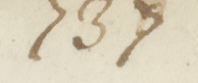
737
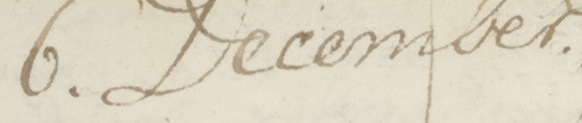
6. December.
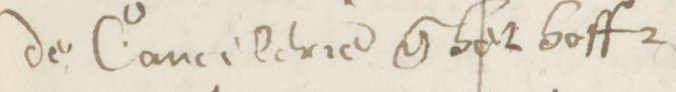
de Cancelerie & het hoff
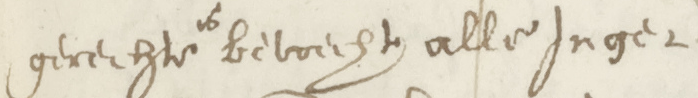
gerechte is bevoechte alle Inge
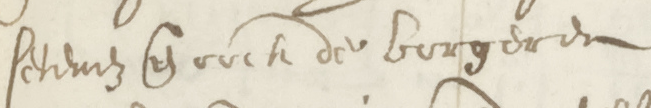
setenen & oock de borgeren
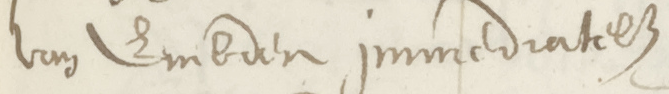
van Embden immediatel
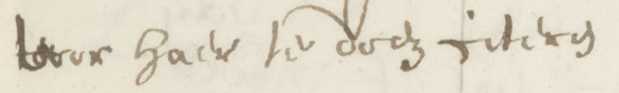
voor haer te doen citeren
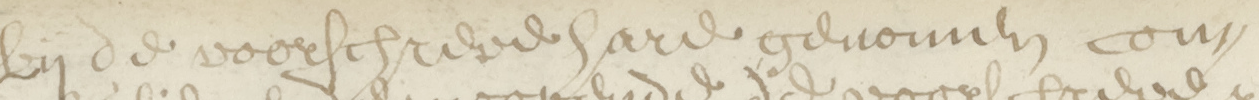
bij de voorschreve hare genomen con„
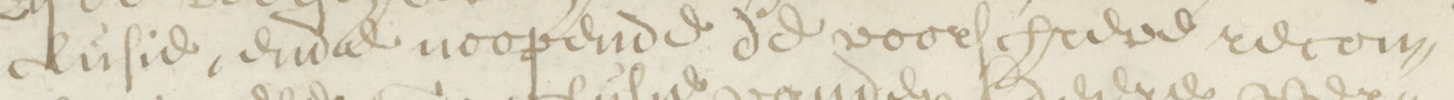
clusie, ende noopende de voorschreve recon„
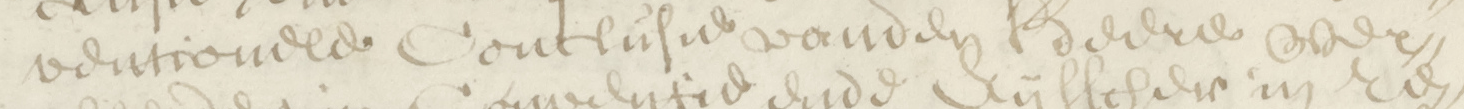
ventionele Conclusie vanden Heere Ver„
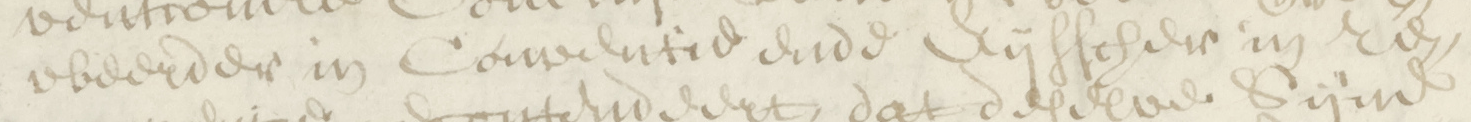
weerder in Conventie ende Eijsscher in re„
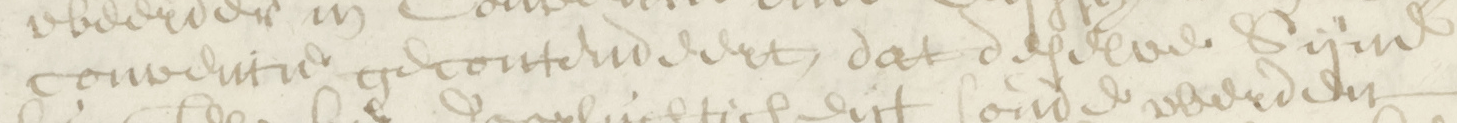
conventie gecontendeert, dat deselve Sijne
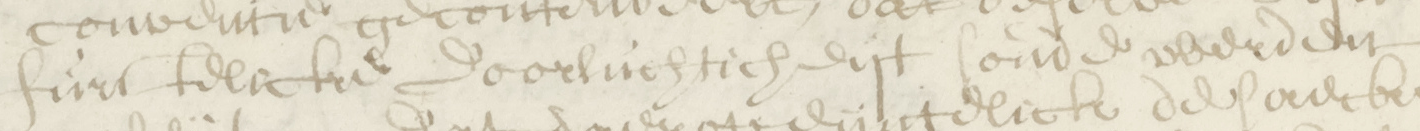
Furstlicke Doorluchticheijt soude werden
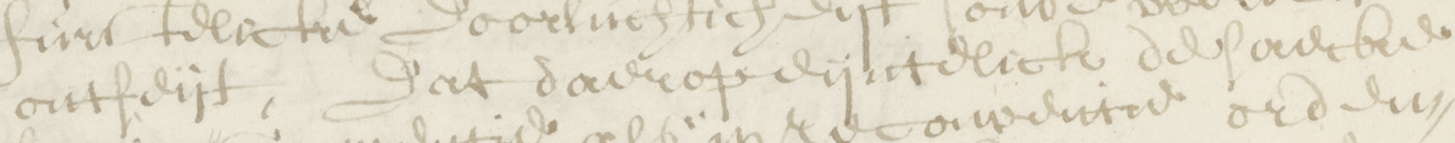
ontseijt, Dat daerop eijntelick de saecke
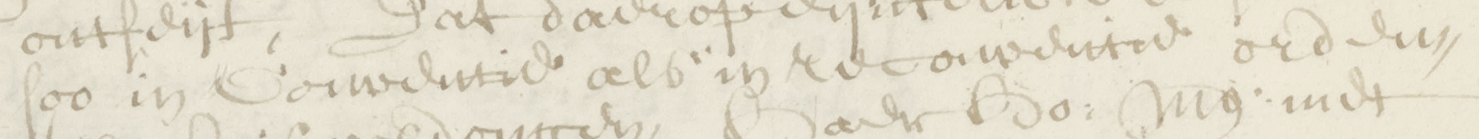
soo in Conventie als in reconventie orden„
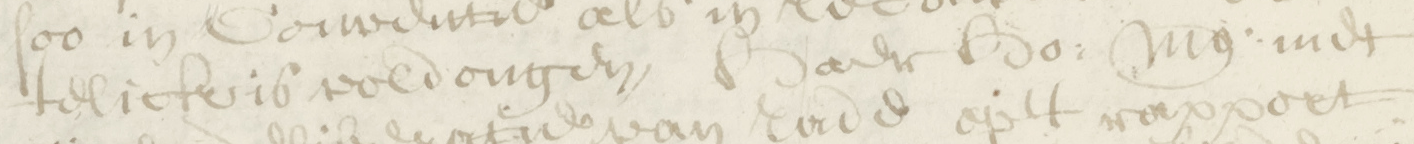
telick is voldongen, Haer Ho:Mo: met
